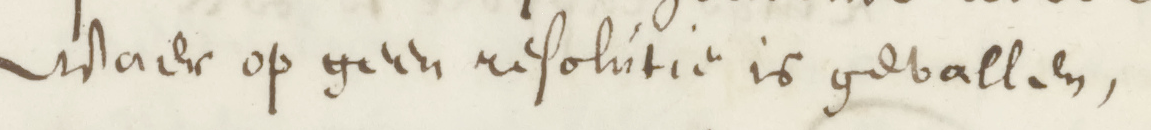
Waer op geen resolutie is gevallen.
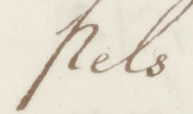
Pels
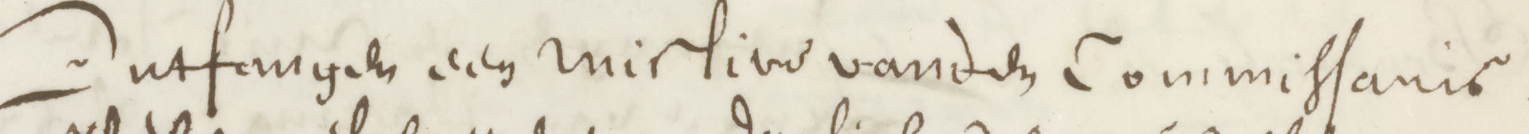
Ontfangen een missive vanden Commissaris
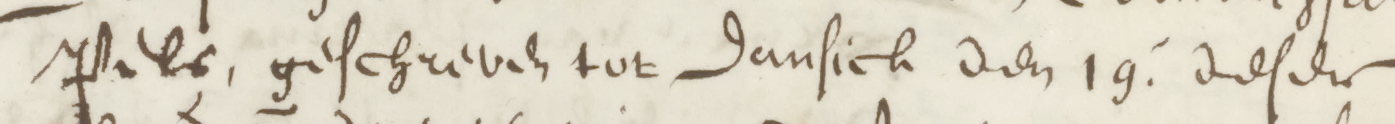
Pels, geschreven tot Dansick den 19e. deser
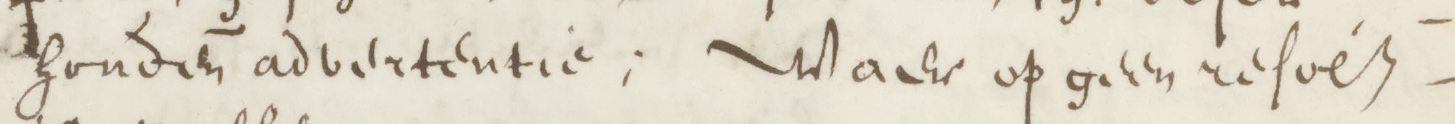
houden advertentie; Waer op geen resol
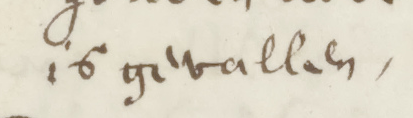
is gevallen.
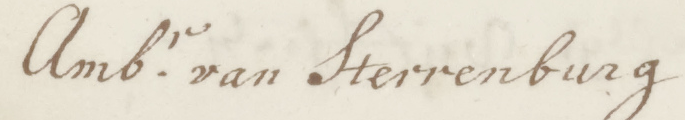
Ambr. van Sterrenburg
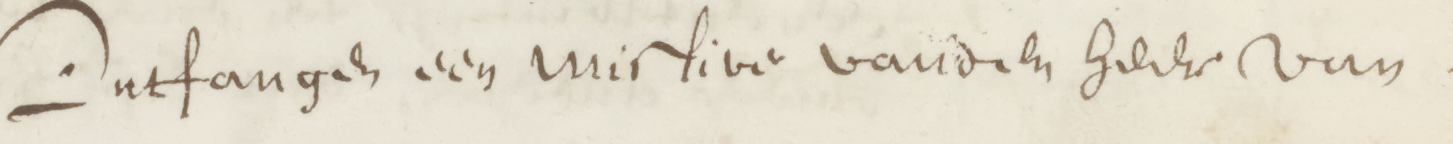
Ontfangen een missive vanden heer van
